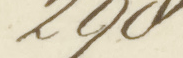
298
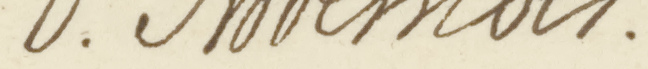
6. November.
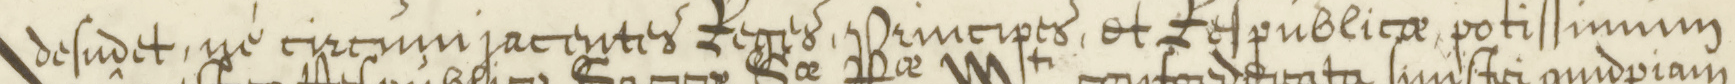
desudet, ne circum jacentes Reges, Principes, et Respublicæ, potissimum
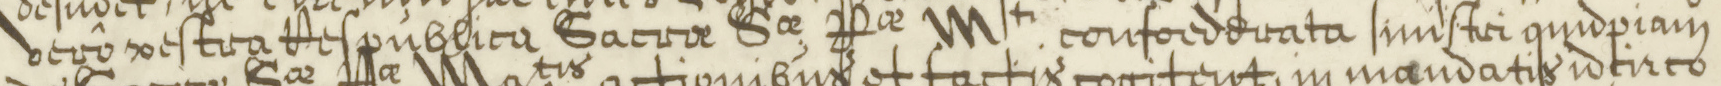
vero vestra Respublica Sacræ Sæ. Ræ. Mti. confoederata sinistri quidpiam
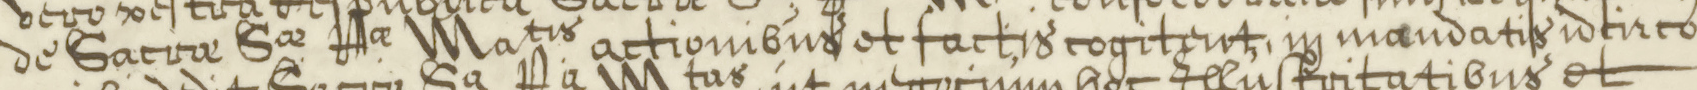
de Sacræ Sæ. Ræ. Mtis. actionibus et factis cogitent, in mandatis idcirco
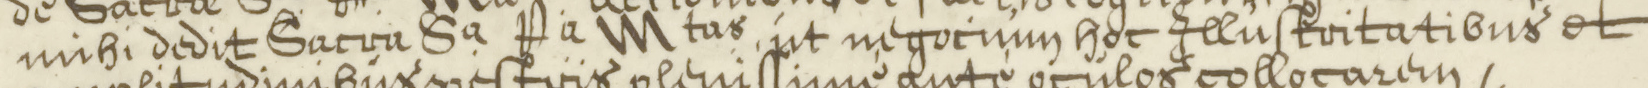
mihi dedit Sacra Sa. Ra. Mtas., ut negocium hoc Illustritatibus et
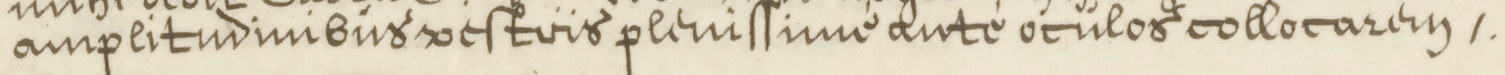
amplitudinibus vestris plenissime ante oculos collocarem.
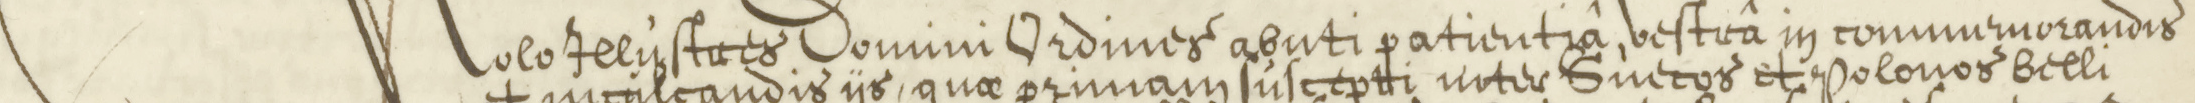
Nolo Illustres Domini Ordines abuti patientia vestra in commemorandis
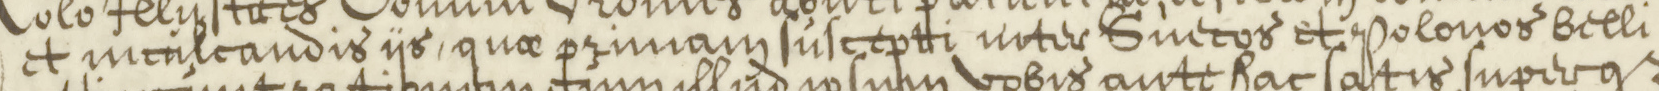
et inculcandis iis, quæ primam suscepti inter Suecos et Polonos belli
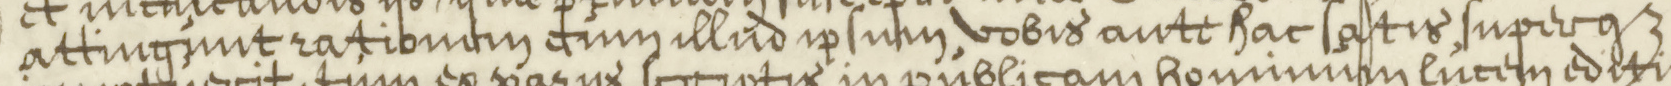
attingunt rationem cum illud ipsum, vobis ante hac satis superque
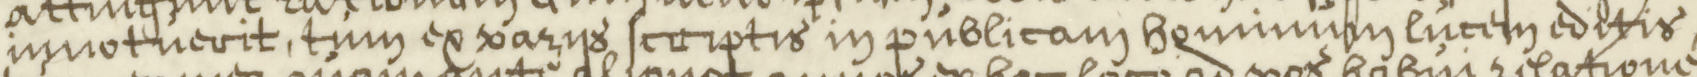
innotuerit, tum ex variis scriptis in publicam hominum lucem editis,
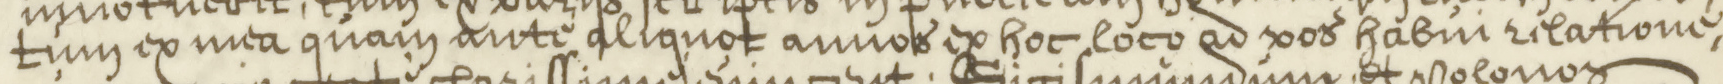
tum ex mea quam ante aliquot annos ex hoc loco ad vos habui relatione,
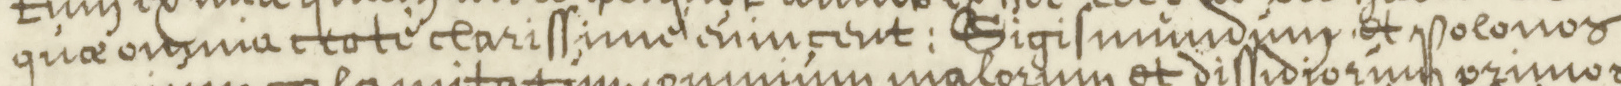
quæ omnia certe clarissime euincent : Sigismundum et Polonos
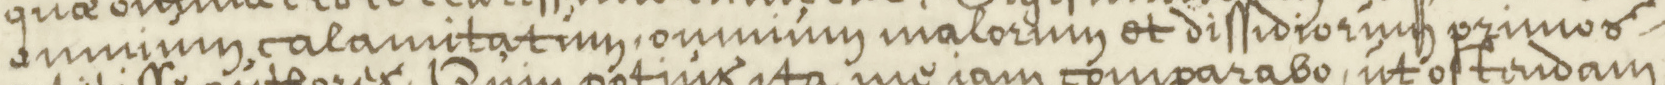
omnium calamitatum, omnium malorum et dissidiorum primos
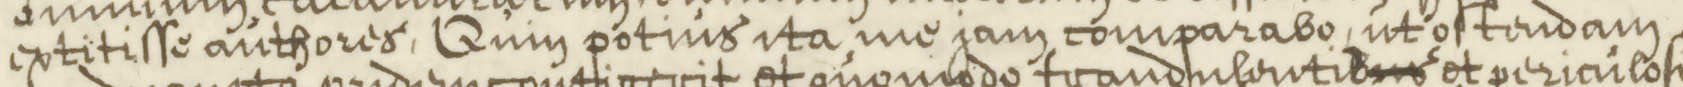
extitisse authores. Quin potius ita me jam comparabo, ut ostendam
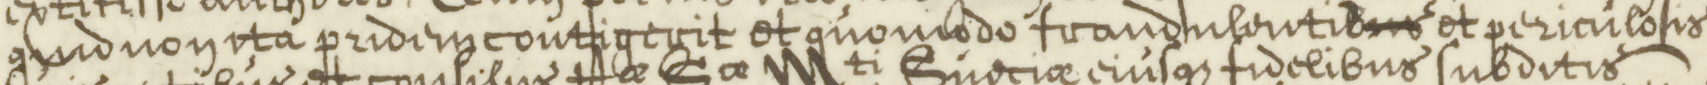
quid non ita pridem contigerit et quomodo fraudulentibus et periculosis
